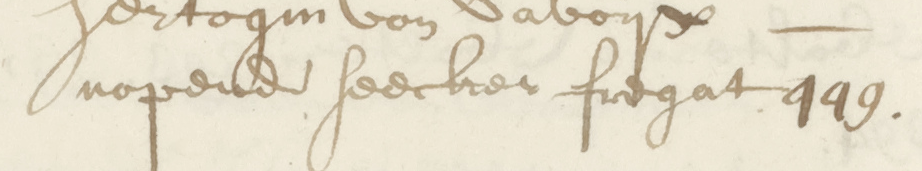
nopende seecker fregat, 449.
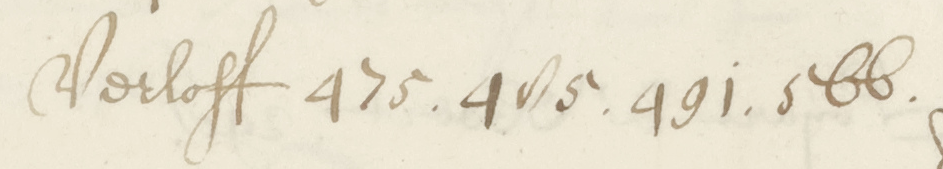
Verloff 475, 485, 491, 566.
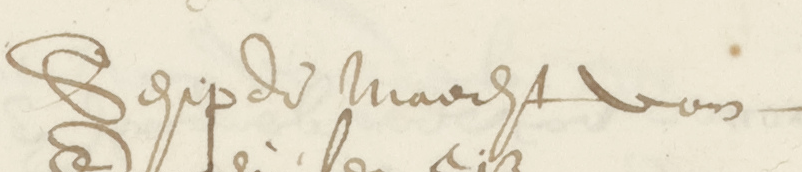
Schip de maecht van
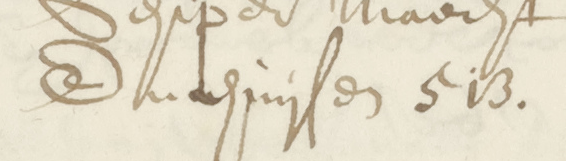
Enchuijsen 513.
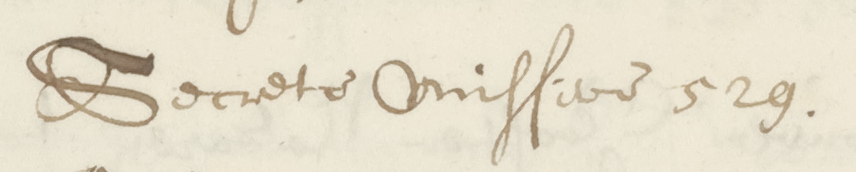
Secrete missive 529.
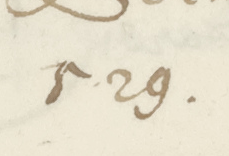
529.
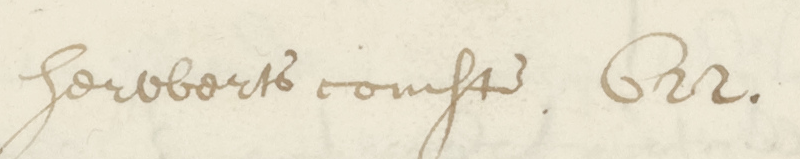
herwerts comste, 622.
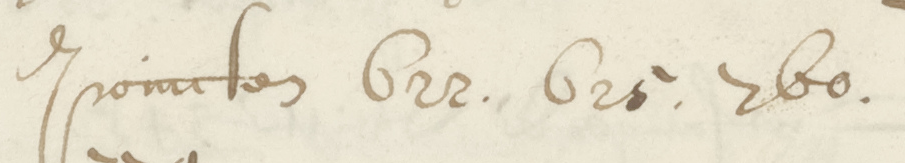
Poincten 622, 625, 760,
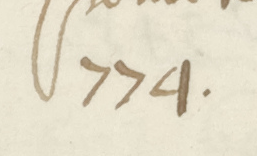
774.
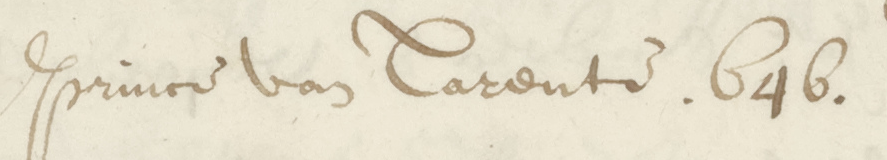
Prince van Tarente, 646.
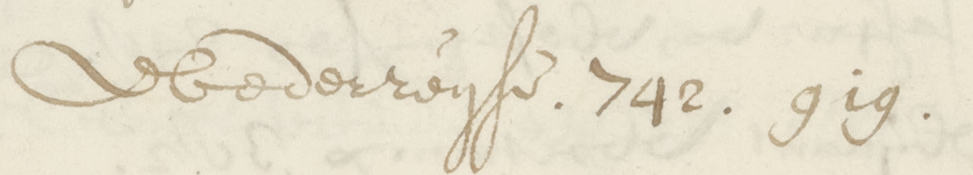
wederreijse, 742, 919.
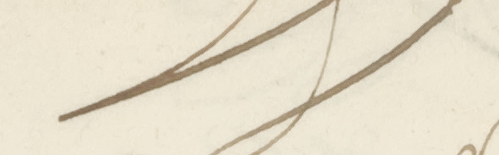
W
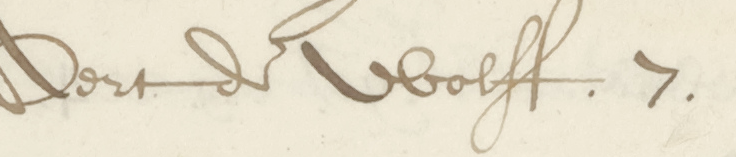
Aert de Wolff, 7.
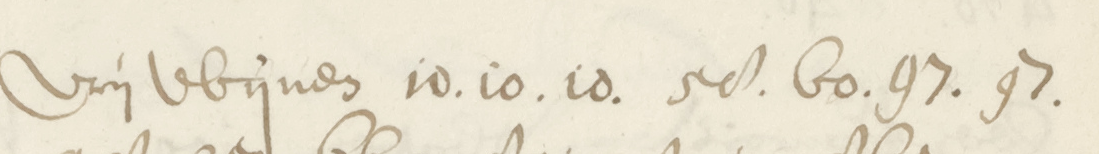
vrij wijnen 10, 10, 10, 58, 60, 97, 97.
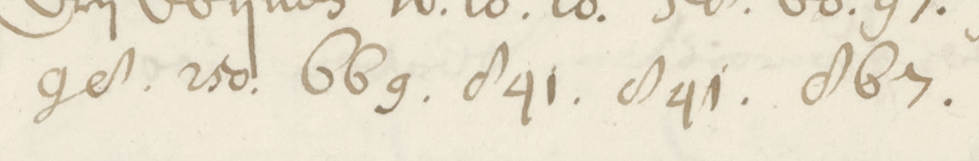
98, 250, 669, 841, 841, 867.
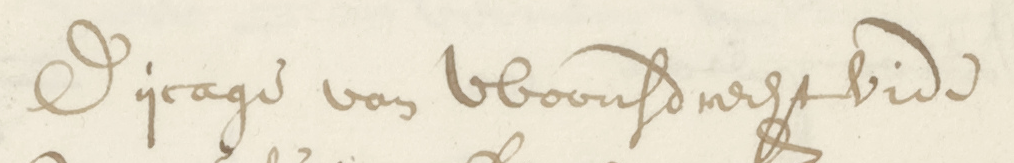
Dijcage van woonsdrecht bide
